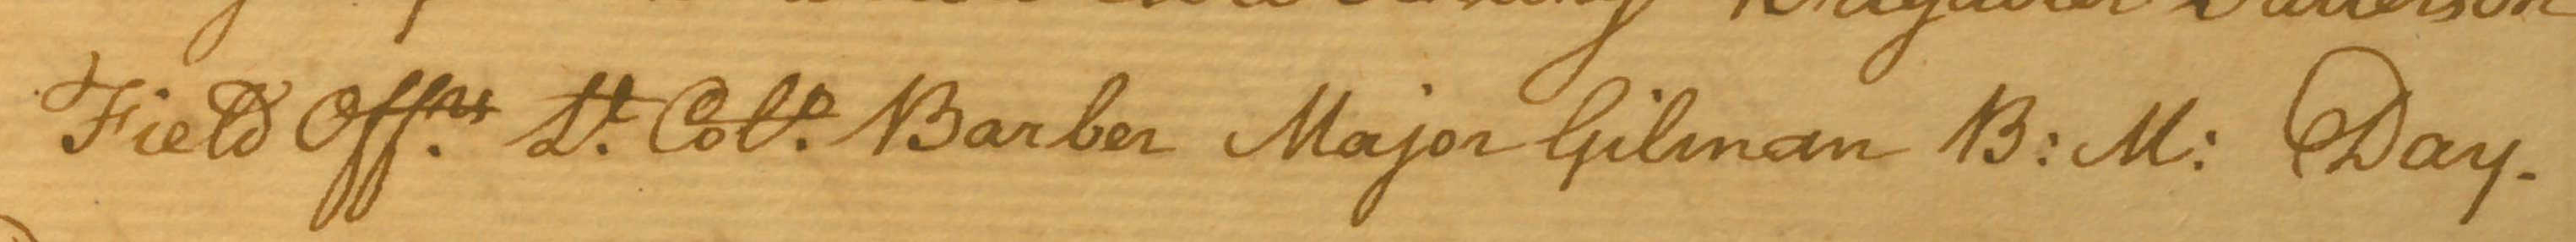Field Off^rs. L^t. Col^o. Barber Major Gilman B: M: Day.
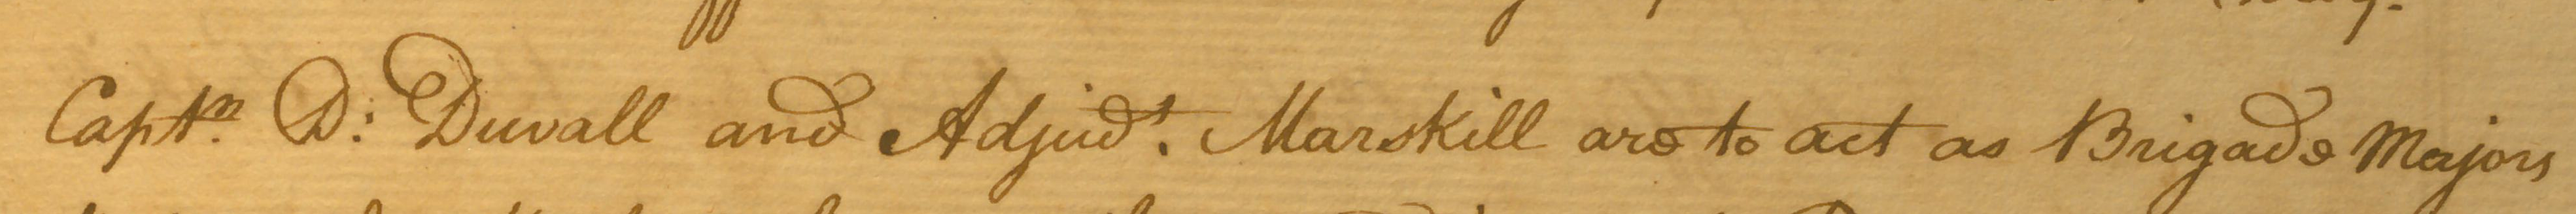Capt^n. D: Duvall and Adjud^t. Marskill are to act as Brigade Majors
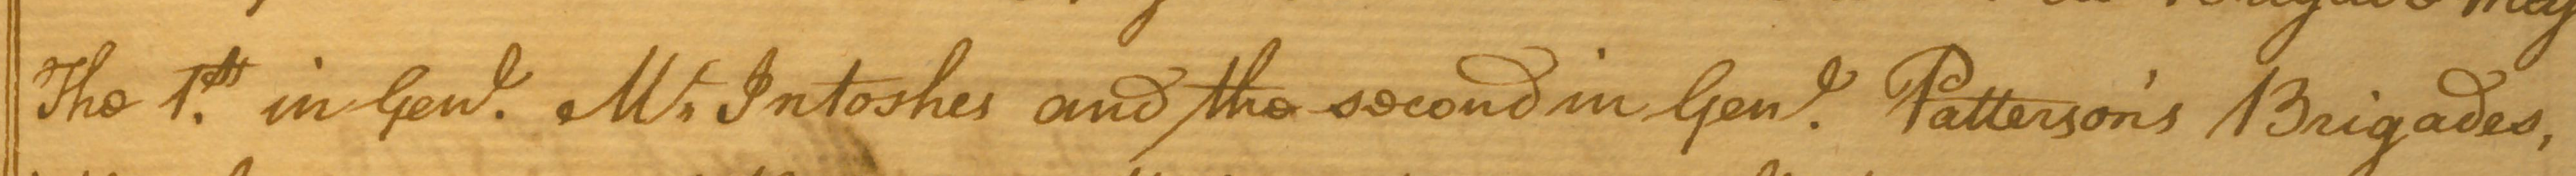The 1^st. in Gen^l. M^c.Intoshes and the second in Gen^l. Patterson's Brigades,
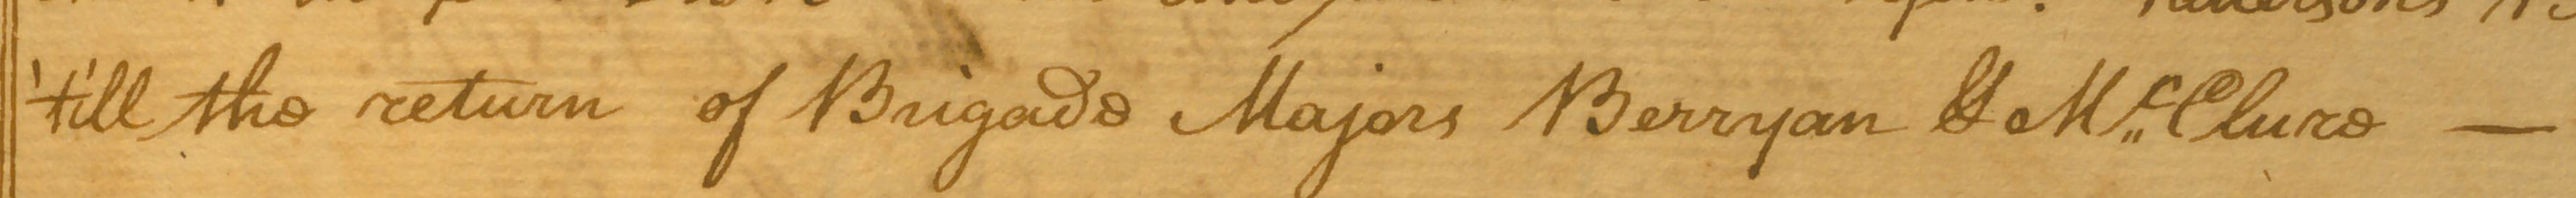'till the return of Brigade Majors Berryan & M^c.Clure-
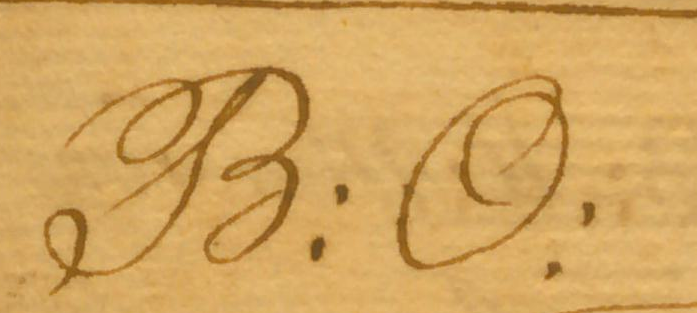B: O:
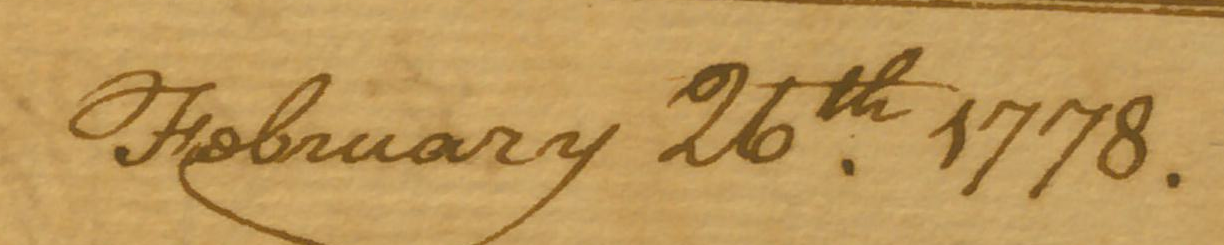February 26^th. 1778.
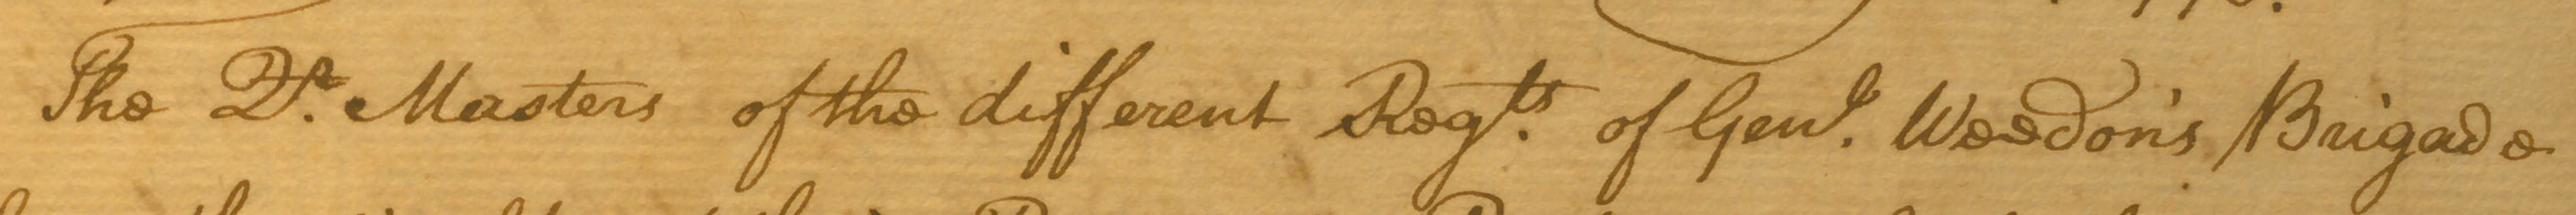The Q^r. Masters of the different Reg^ts. of Gen^l. Weedon's Brigade
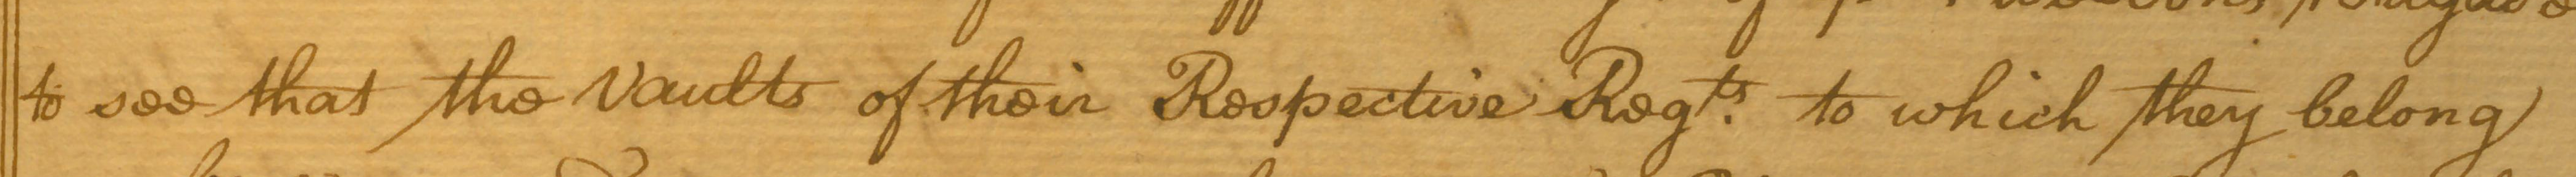to see that the vaults of their Respective Reg^ts. to which they belong
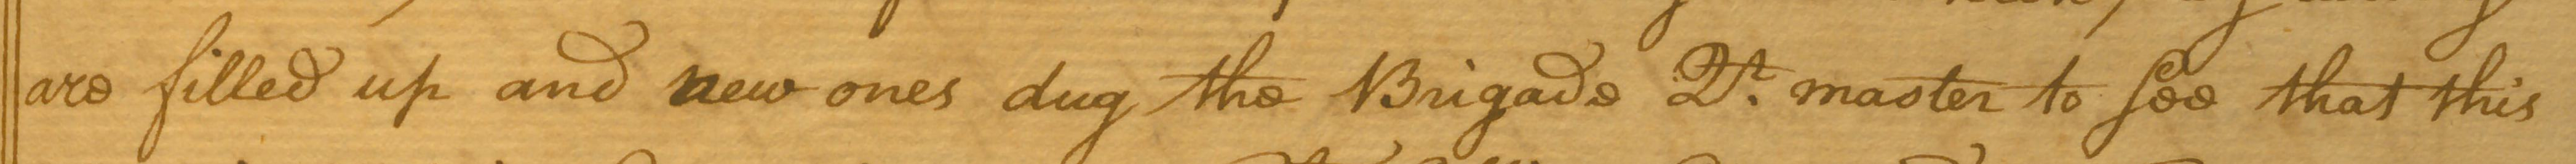are filled up and new ones dug the Brigade Q^r. master to see that this
